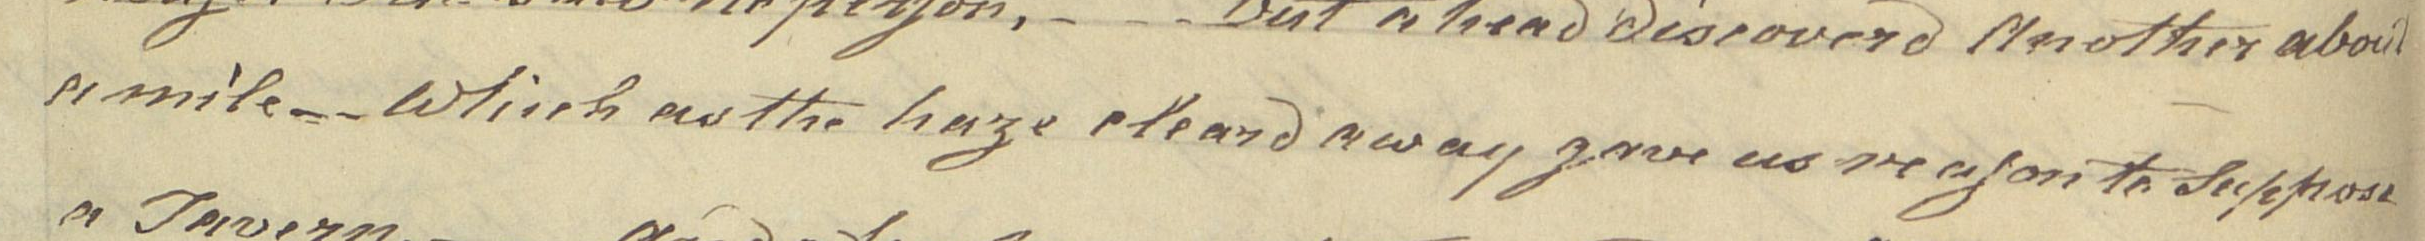a mile which as the haze cleard away gave us reason to suppose
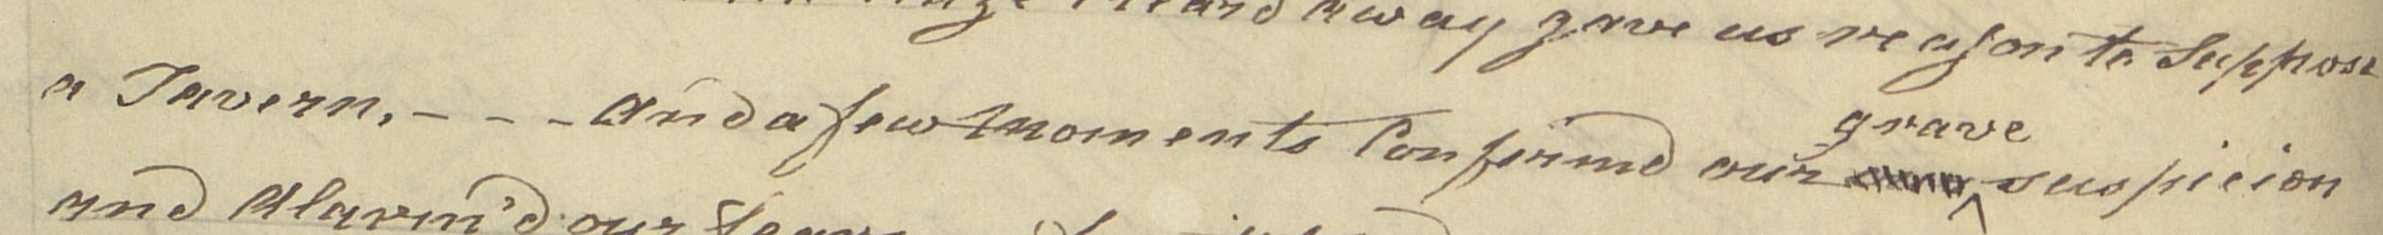a Tavern, And a few moments confirmd our ^ suspicion
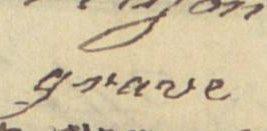grave
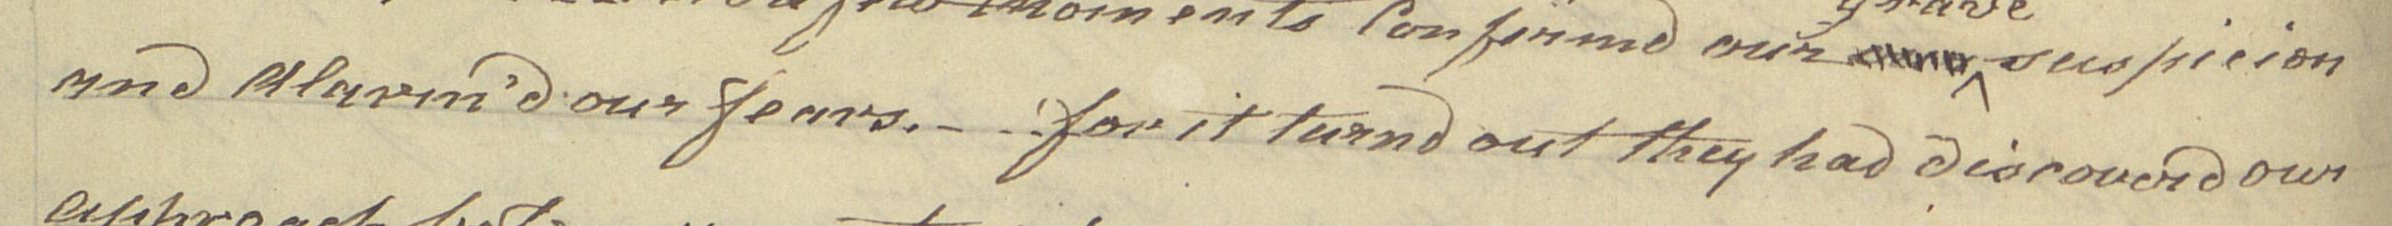and alarm'd our fears. for it turnd out they had discoverd our
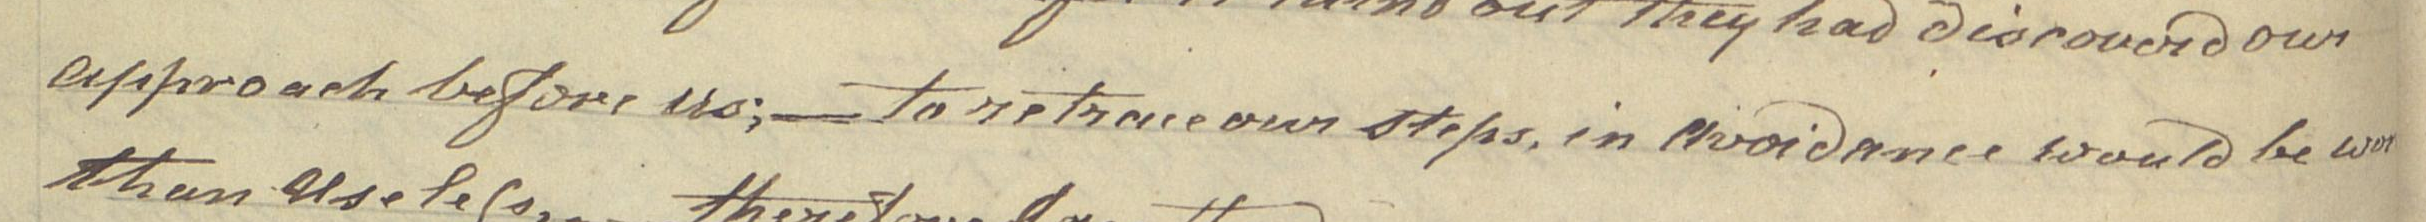approach before us; to retrace our steps, in avoidance would be wo-
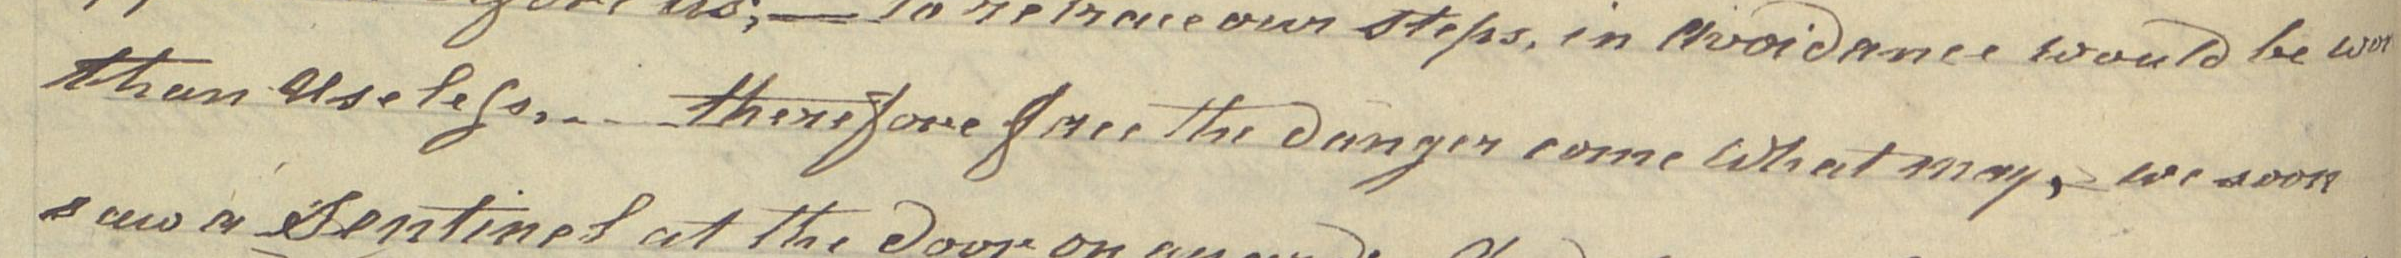than use less, therefore face the danger come what may, we soon
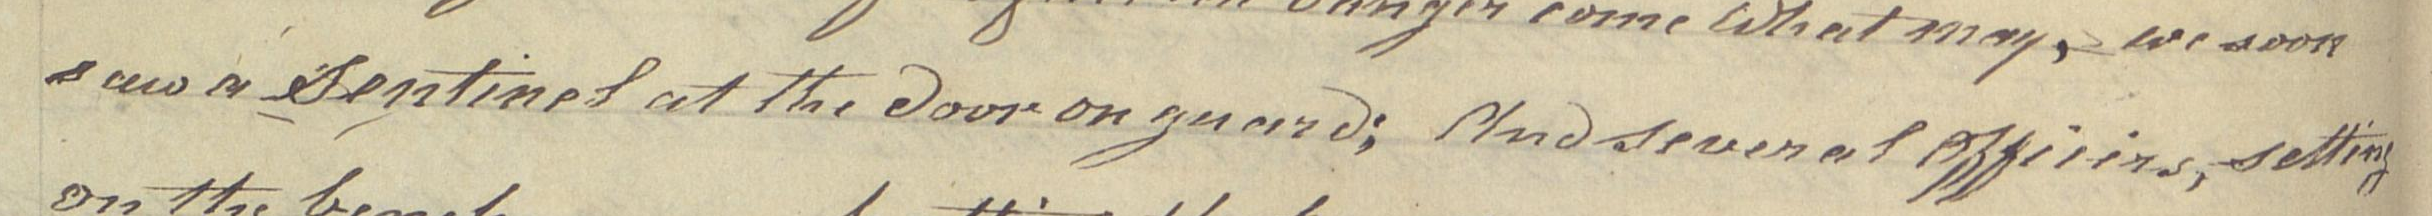saw a Sentinel at the door on guard; And Several Officers, setting
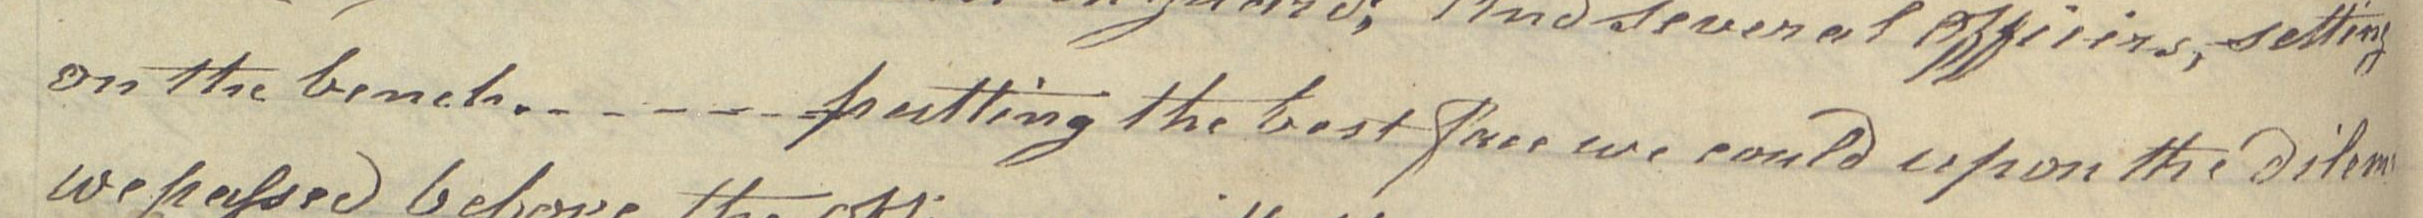on the bench. putting the best face we could upon the dilem-
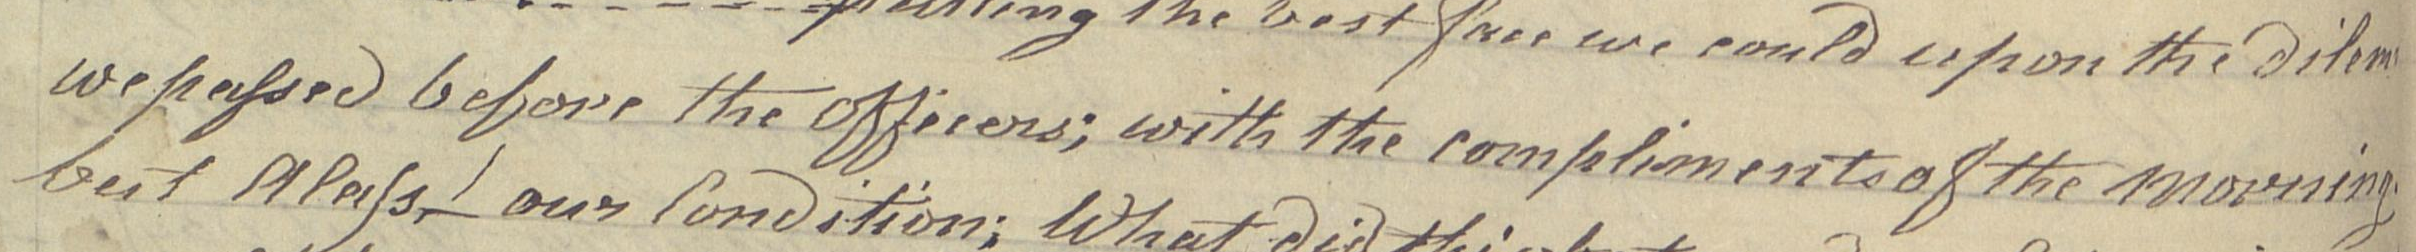we passed before the officers; with the compliments of the morning
